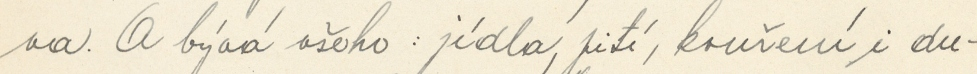va. A bývá všeho: jídla, pití, kouření i du-
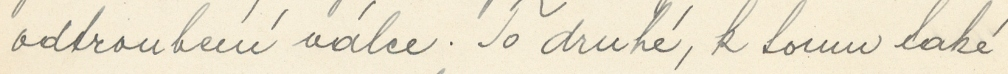odtroubení válce. To druhé, k tomu také
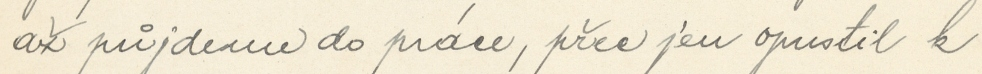až půjdeme do práce, přec jen opustit k
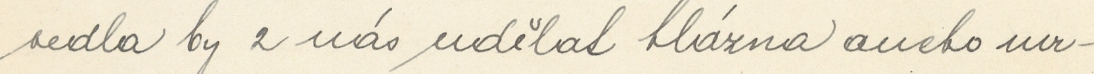vedla by z nás udělat blázna anebo mr-
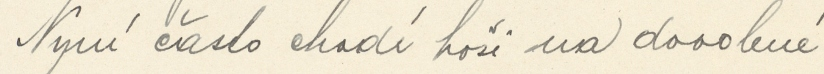Nyní často chodí hoši na dovolené
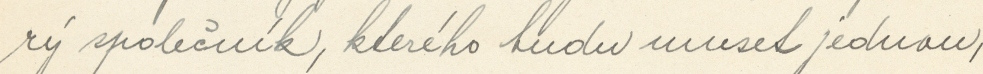rý společník, kterého budu muset jednou,
